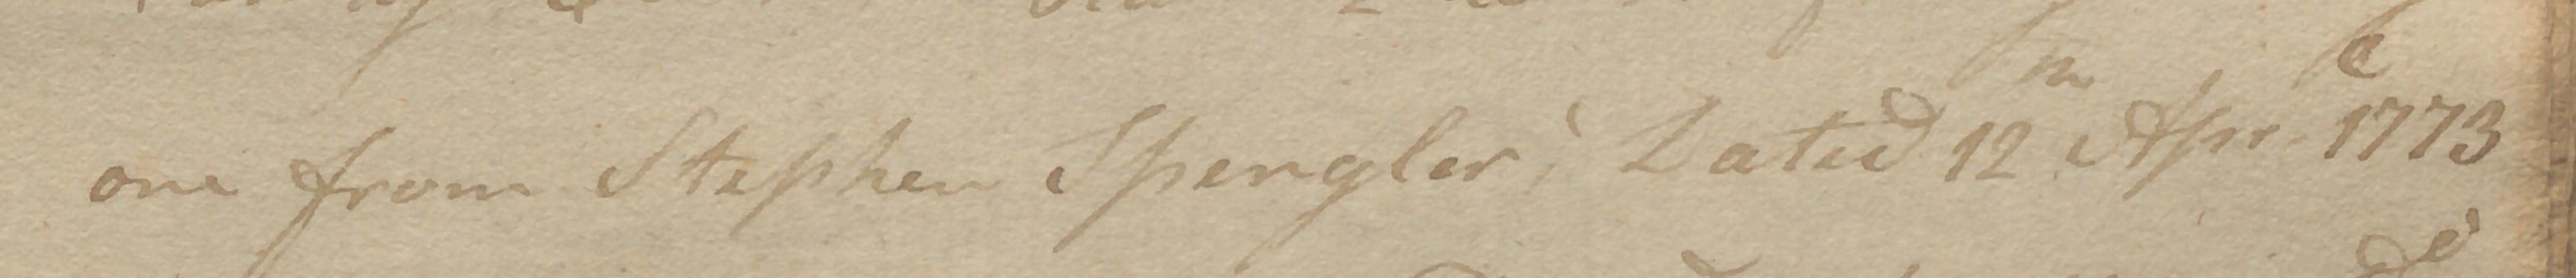one from Stephen Spengler Dated 12^th Apr^l 1773
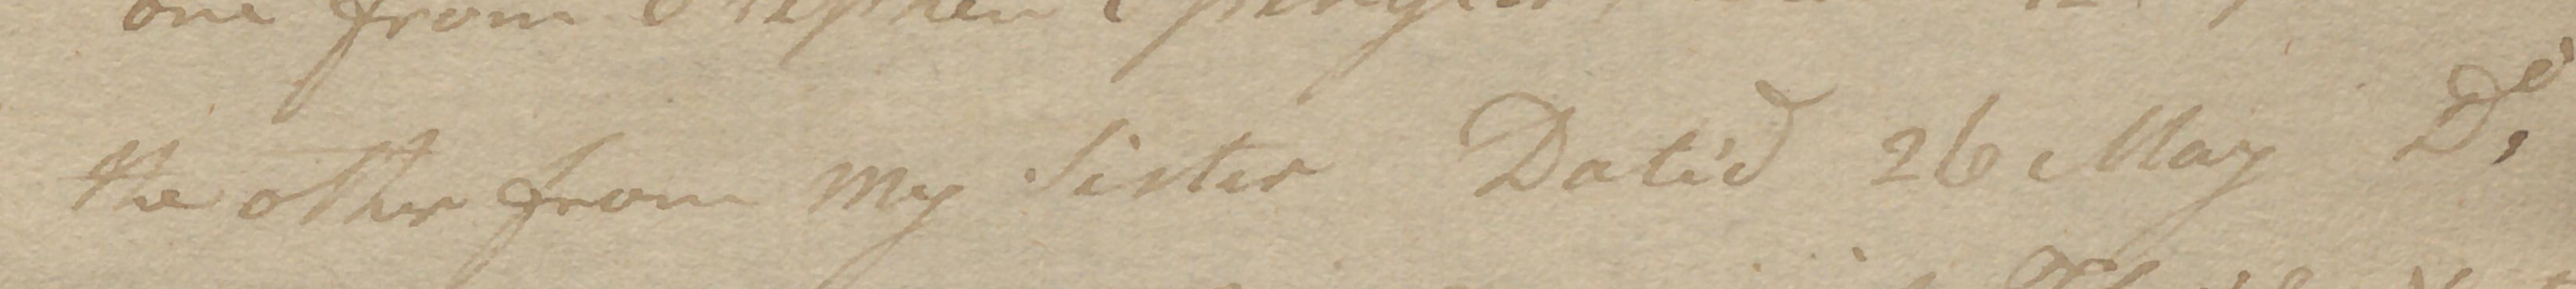the other fron My Sister Datee 26 May D^o.
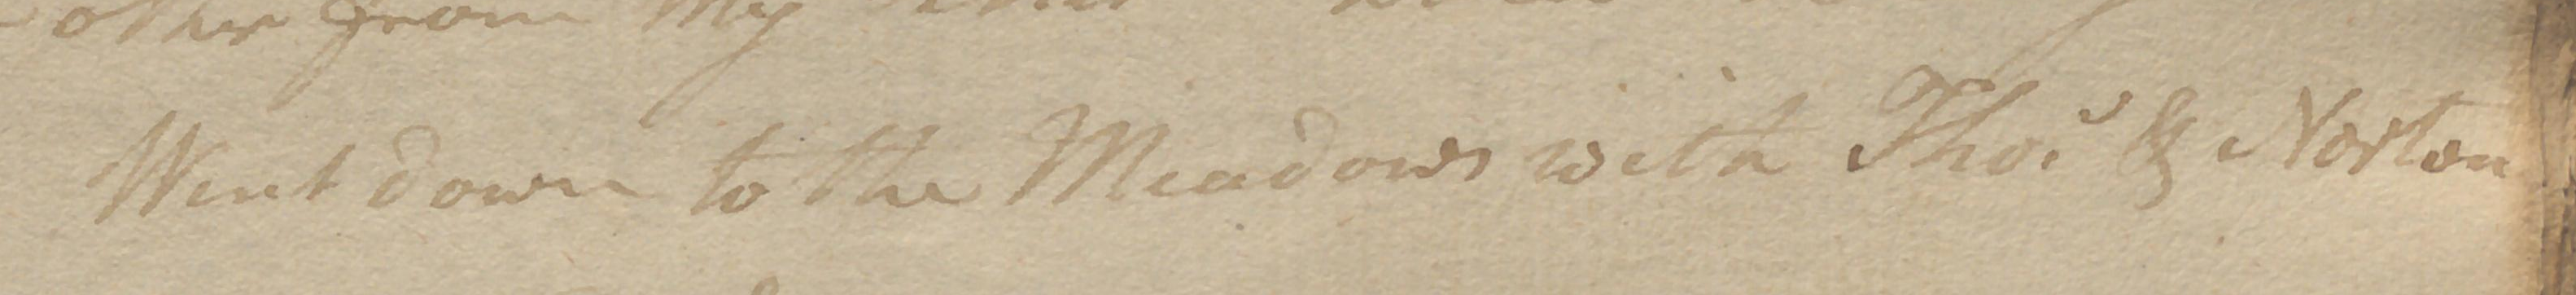Went down to the Meadows with Tho^s. & Norton
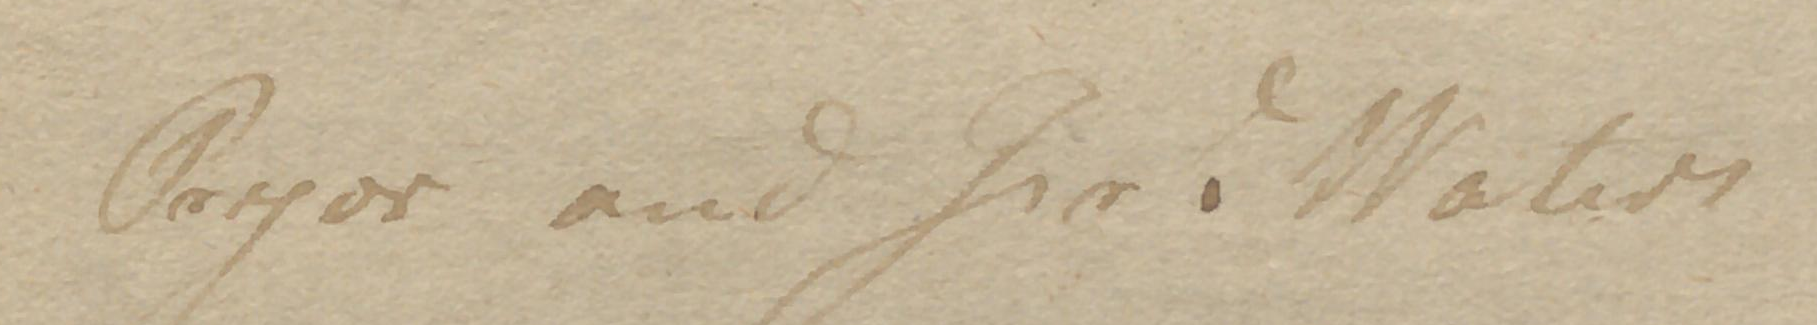Pryor and Isr^l. Waters
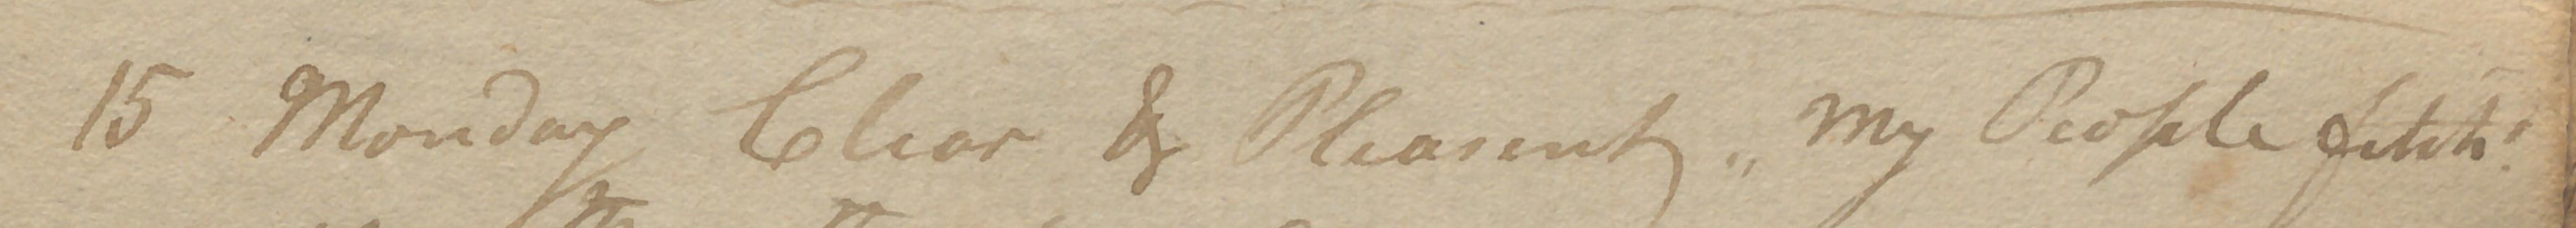15 Monday Clear & Pleasent, My People fetch^d
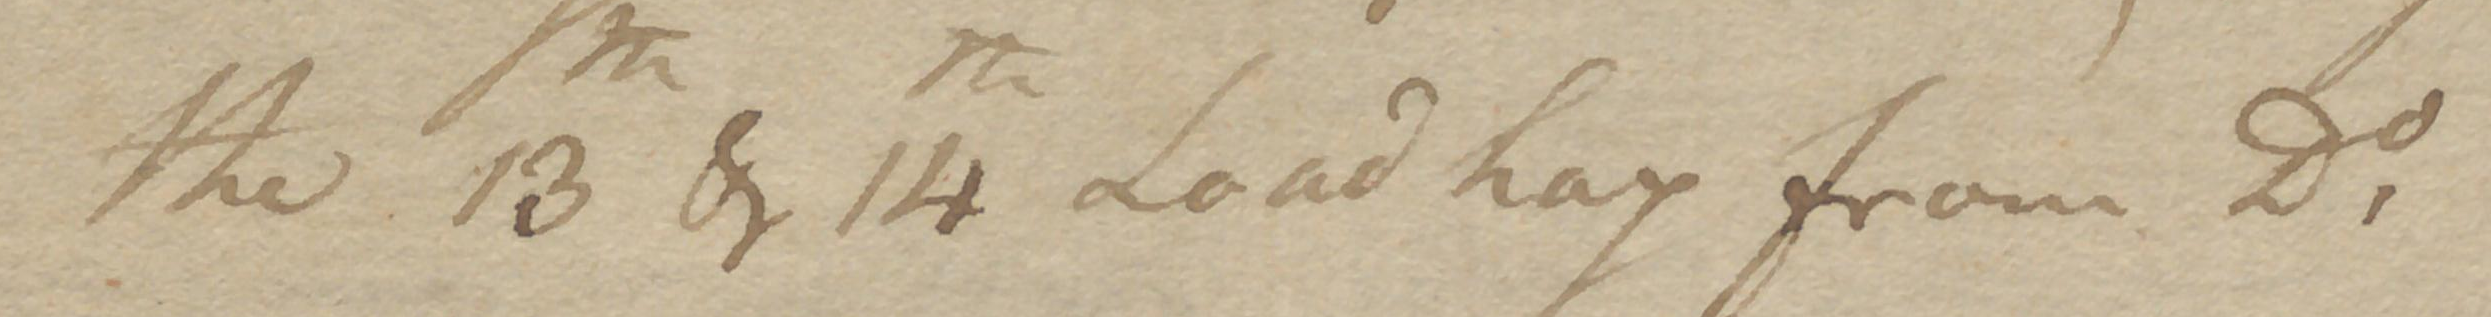the 13^th & 14^th Load hay from D^o.
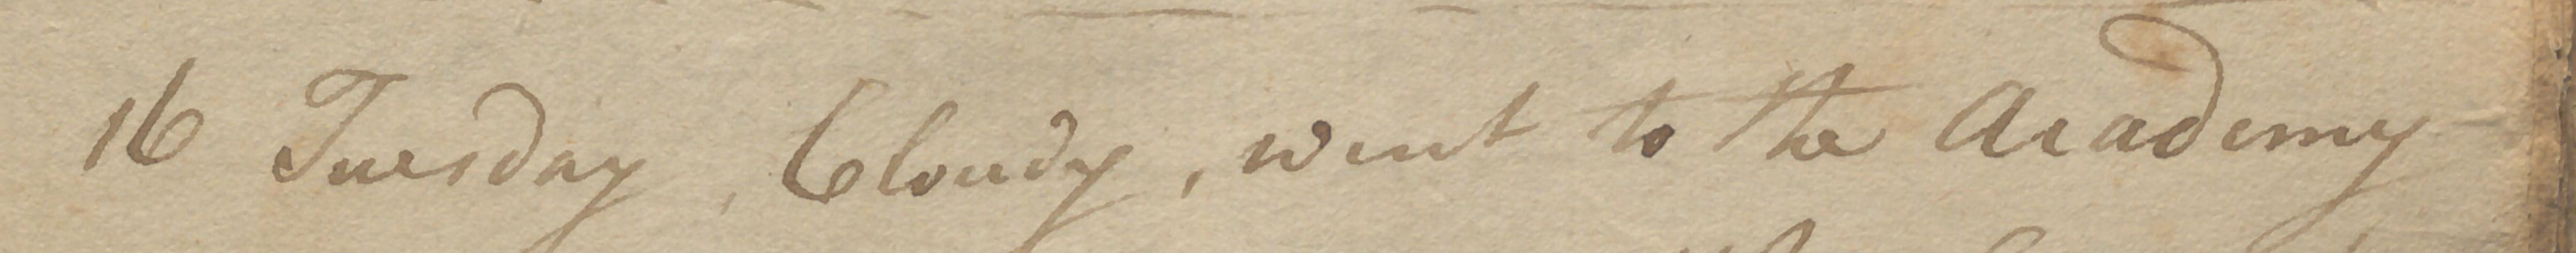16 Tuesday Cloudy, went to the Academy
